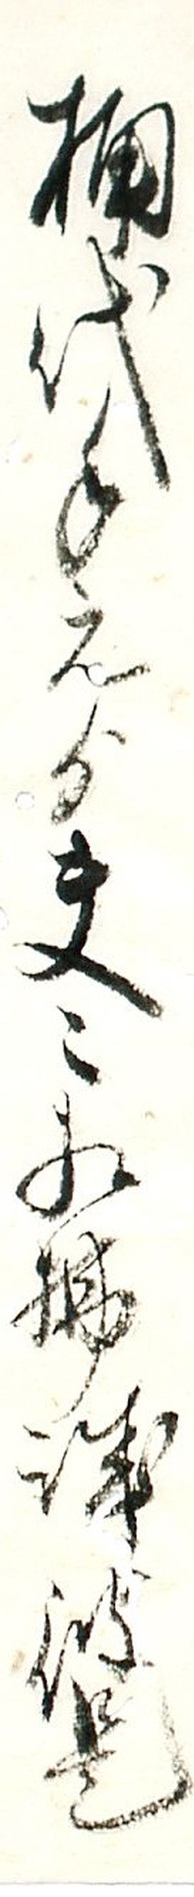桶代手元ゟ夫々相払誠に彼是
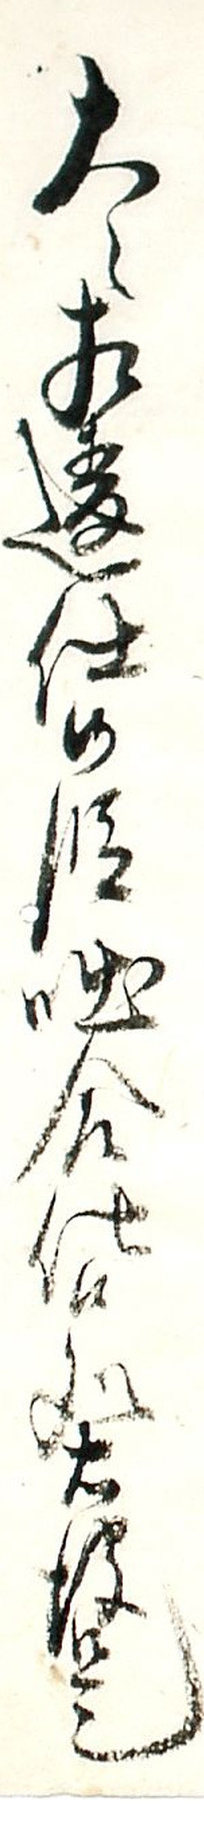大に相違仕候段咄合仕候処右彼是
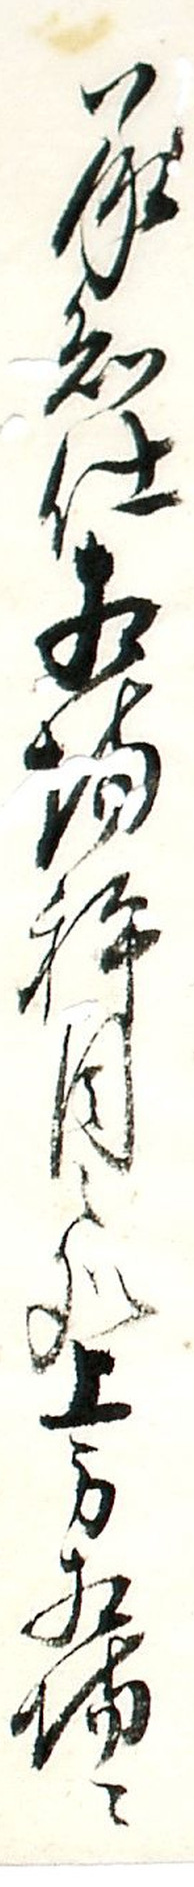承知仕相場秤目之処上方相場に
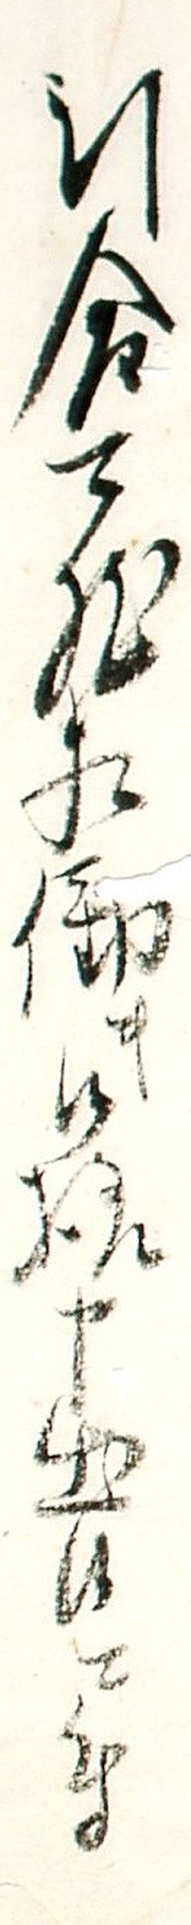引合可然相働き候様申出候に付
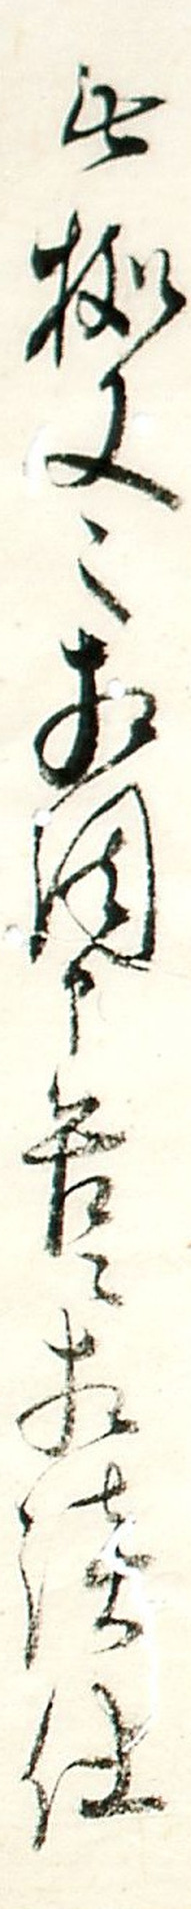無拠又々相調申筈に相談仕
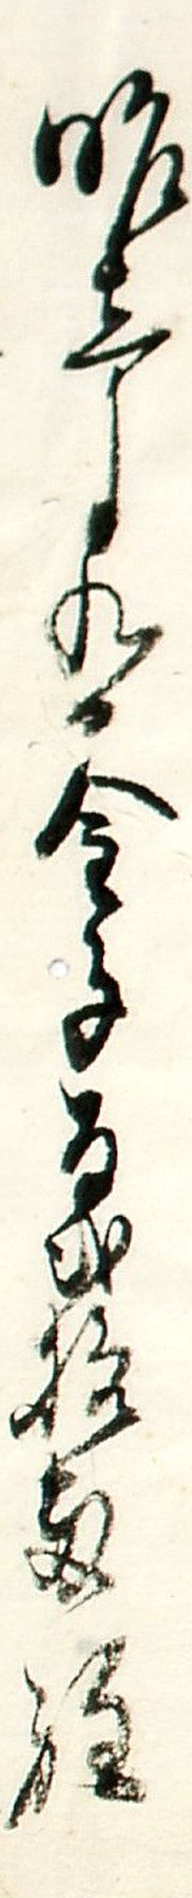昨十二月九日金子百弐拾両程
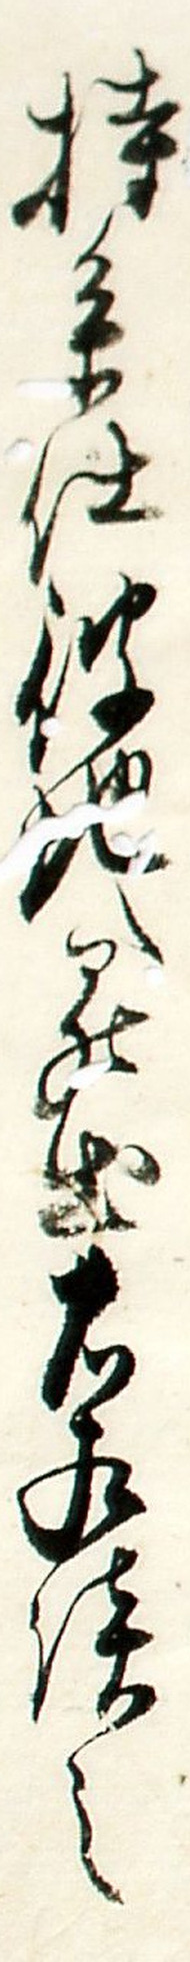持参仕彼地へ罷出右相談之
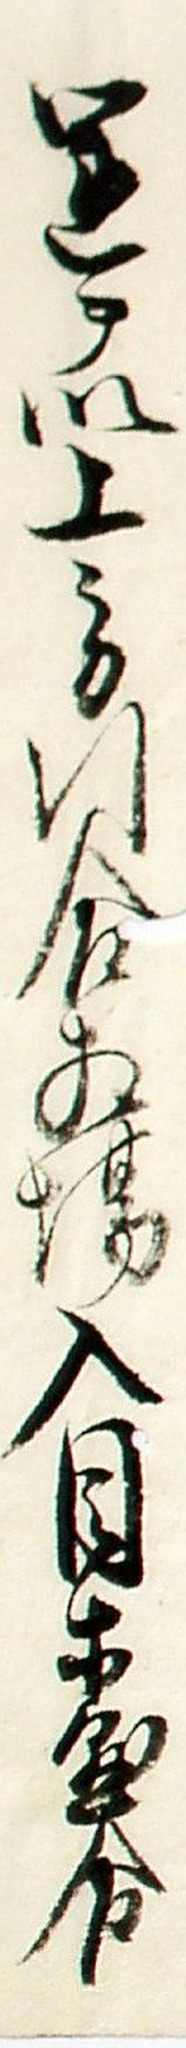運を以上方引合相場入目等懸合
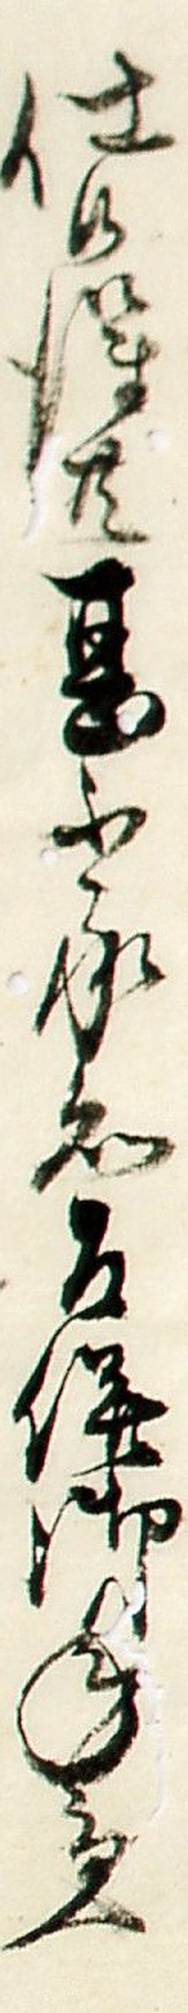仕候得共甚不承知乍併御年貢

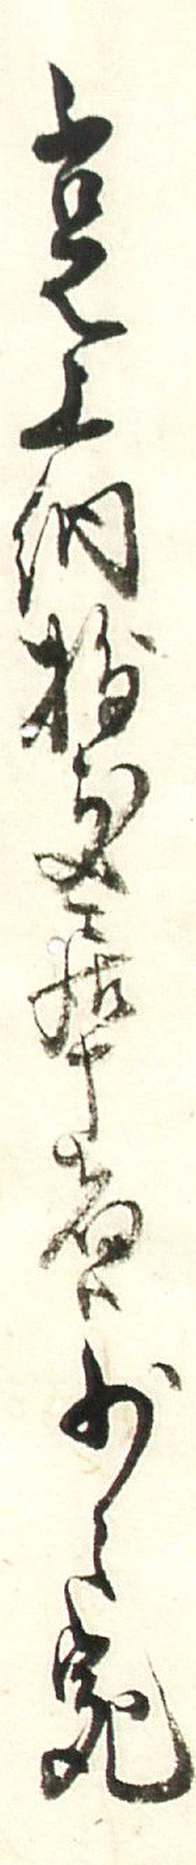不足上納指支居申者は少々宛
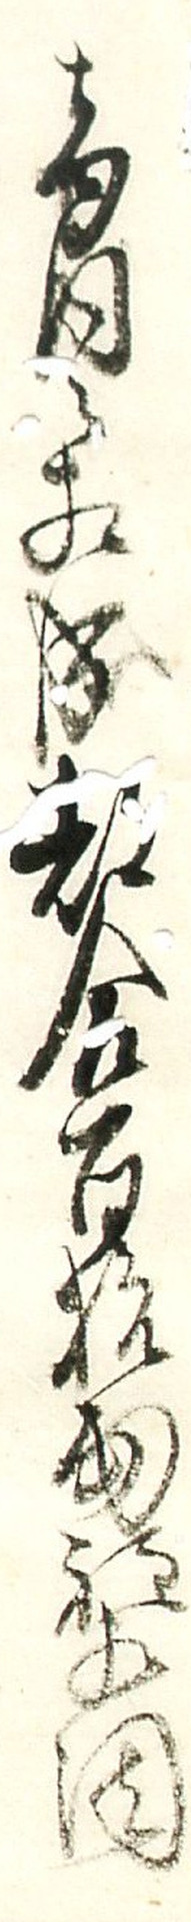商内に相成都合百拾両程相調
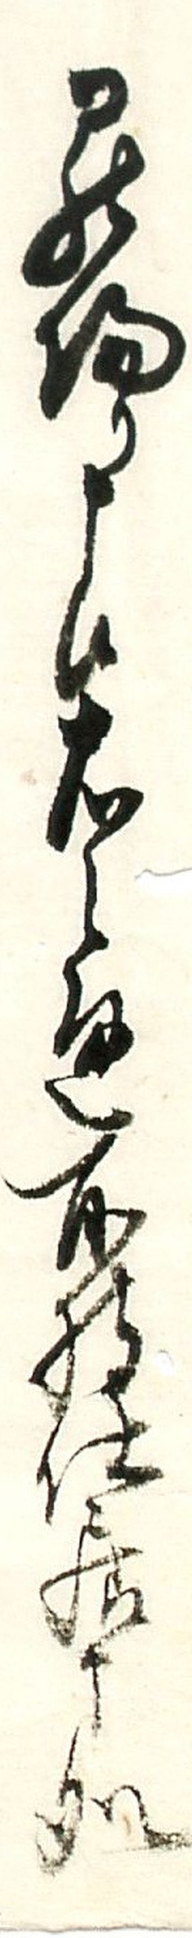罷帰り申候右之通所持仕居申処
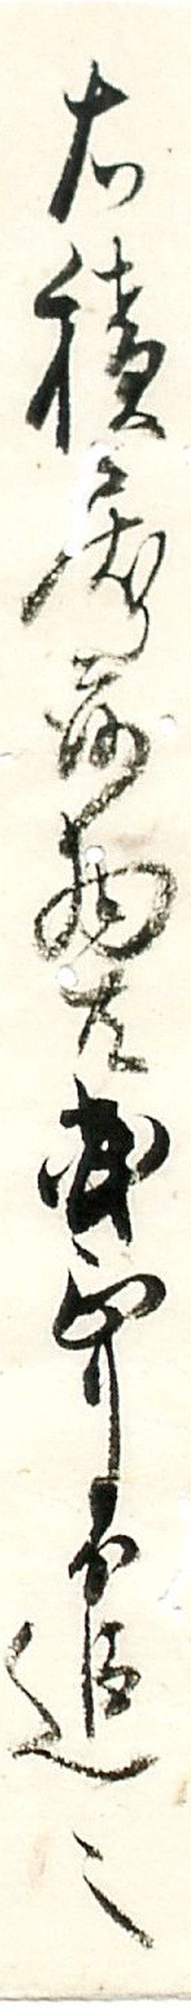右積戻り荷物共当正月ゟ追々
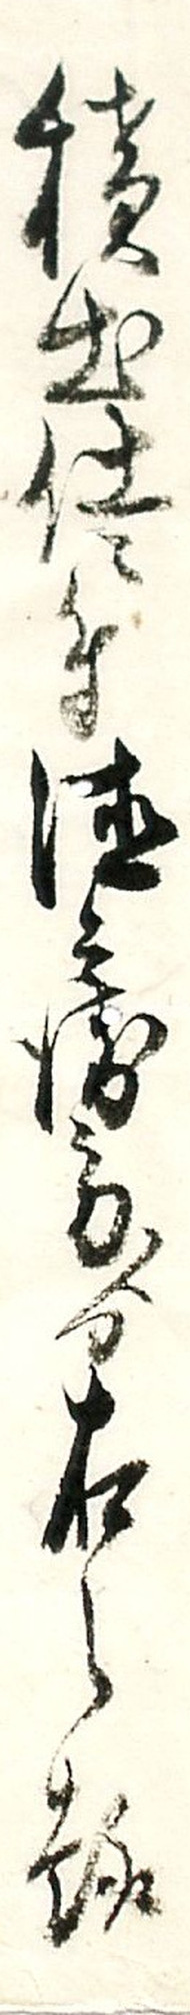積出仕に付徳兵衛方ゟ右之趣
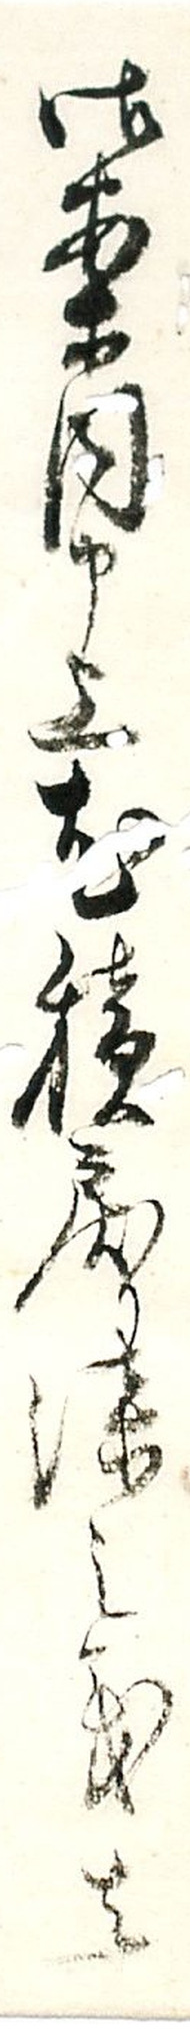御案内申上尤積戻り漆之義は
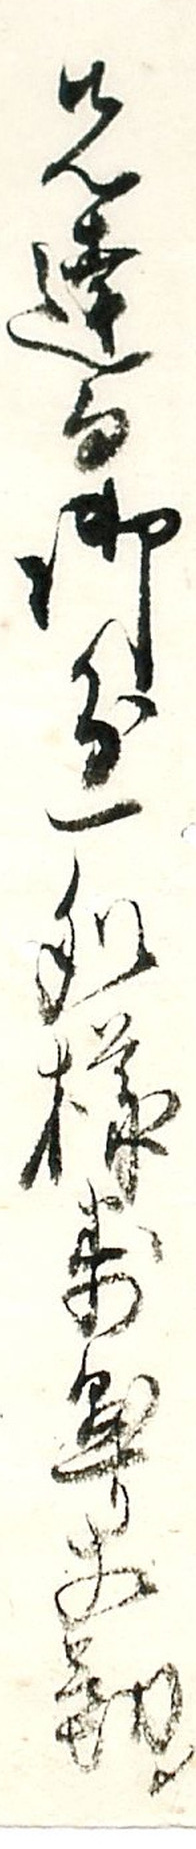先達而御分一処様寄懸り相勤め
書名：乍恐横切ヲ以奉申上覚（山城谷漆買入銀一件ニ付）
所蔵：鳴門教育大学 Naruto University of Education
